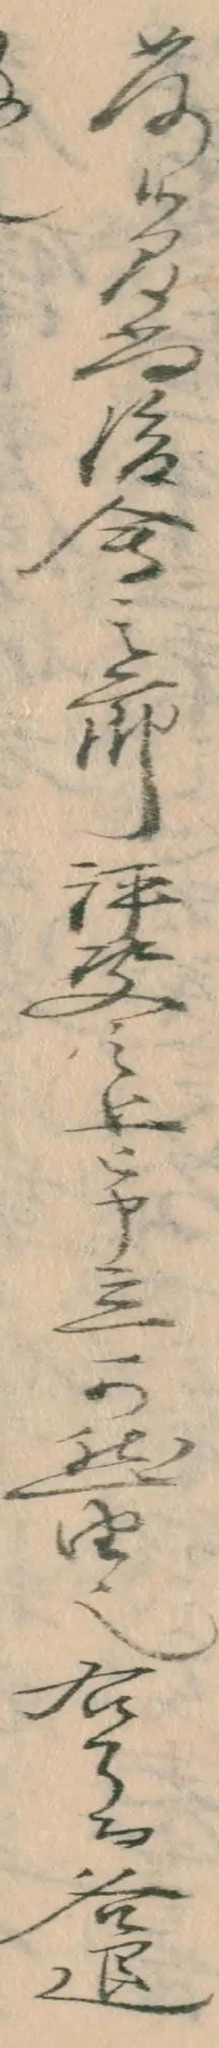如何候間尚後會之節評決之上被申立可然由也右了而各退
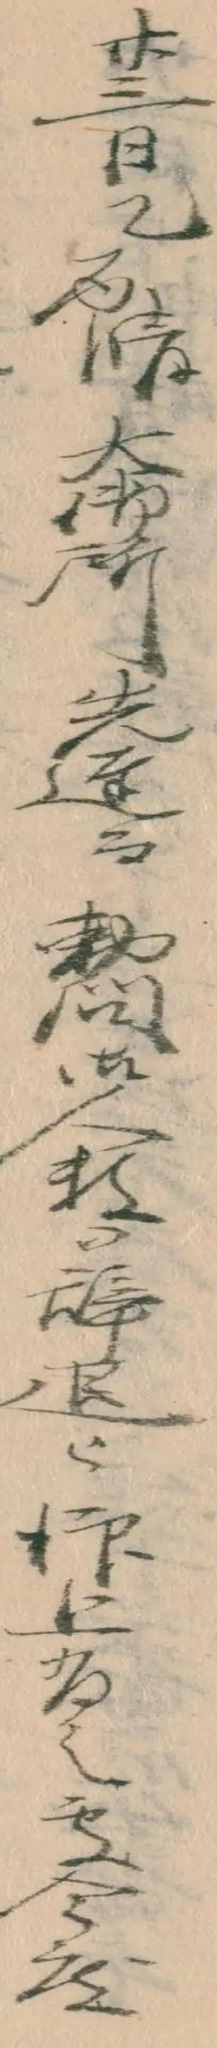廿三日乙酉晴大御所先達而勅問御人数御辞退被仰上有之處今度
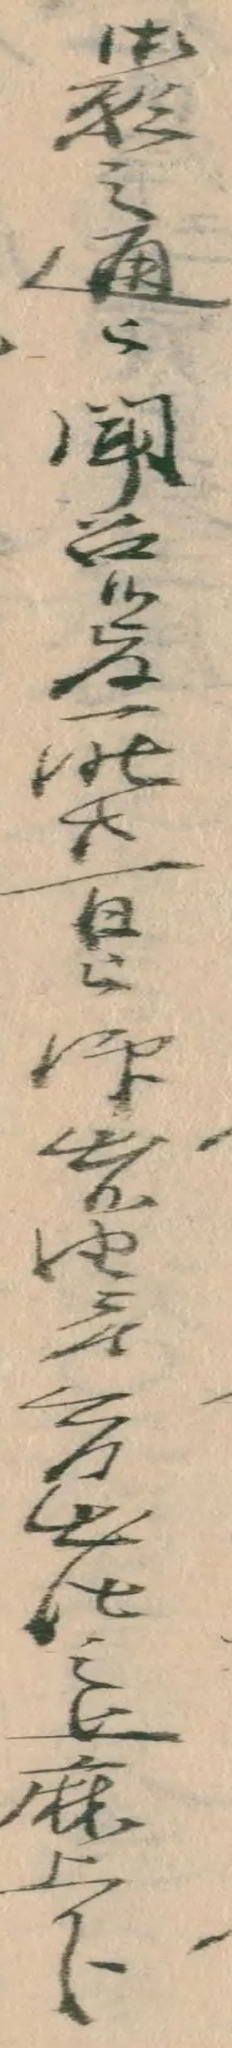御頼之通被聞召候旨一昨廿一日被仰出候由ニ付今日出仕之上麻上下
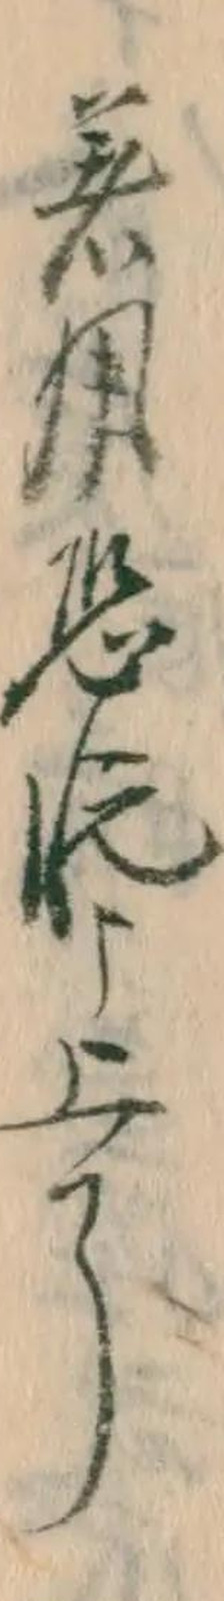着用恐悦申上了
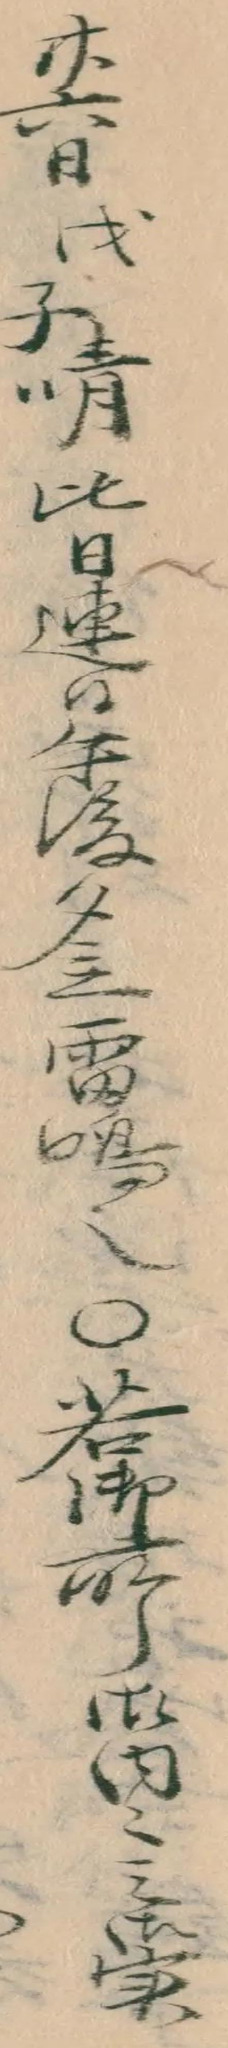廿六日戊子晴比日連日半後夕立雷鳴也○若御所之御内々之御実
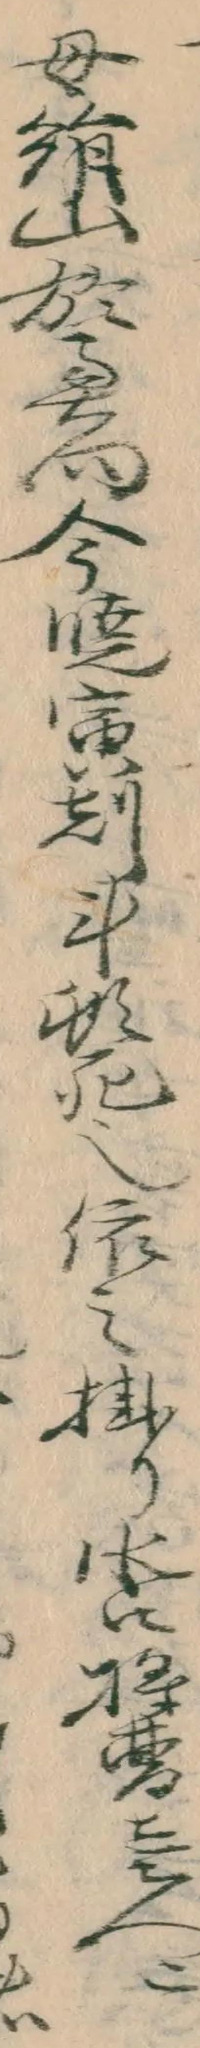母絹山於奥向今晩寅刻斗頓死也依之掛り水口将曹壱人被
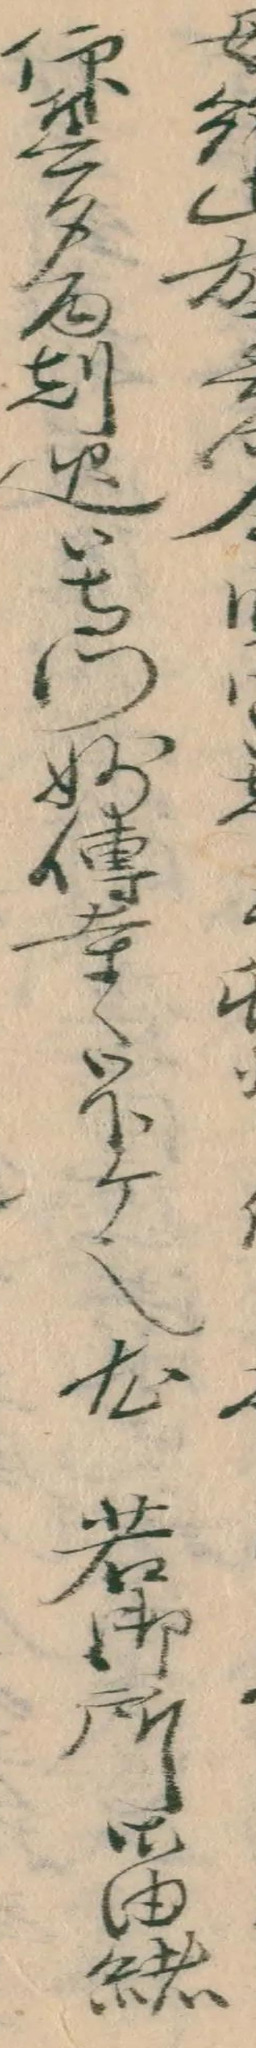仰付今夕酉刻過御寺門妙傳寺へ御下ケ也尤若御所御由緒
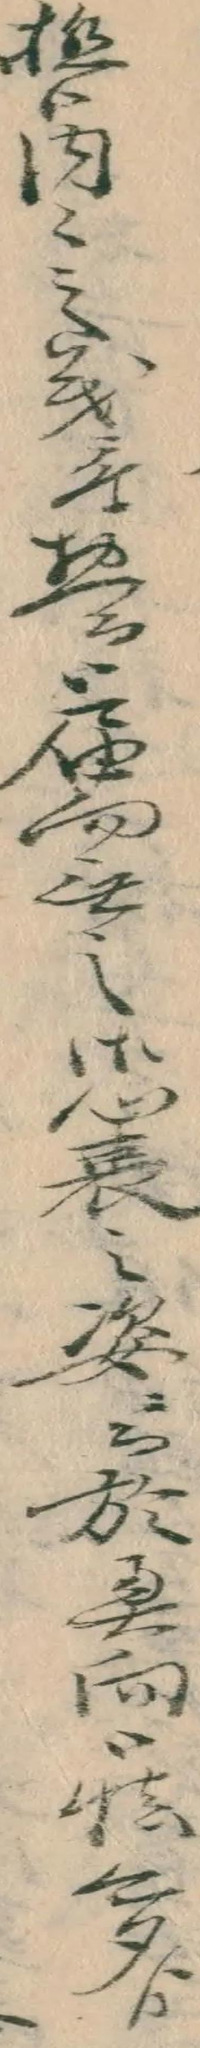極ハ内々之義ニ付惣而御届向無之御心喪之姿ニ而於奥向御慎今夕ゟ
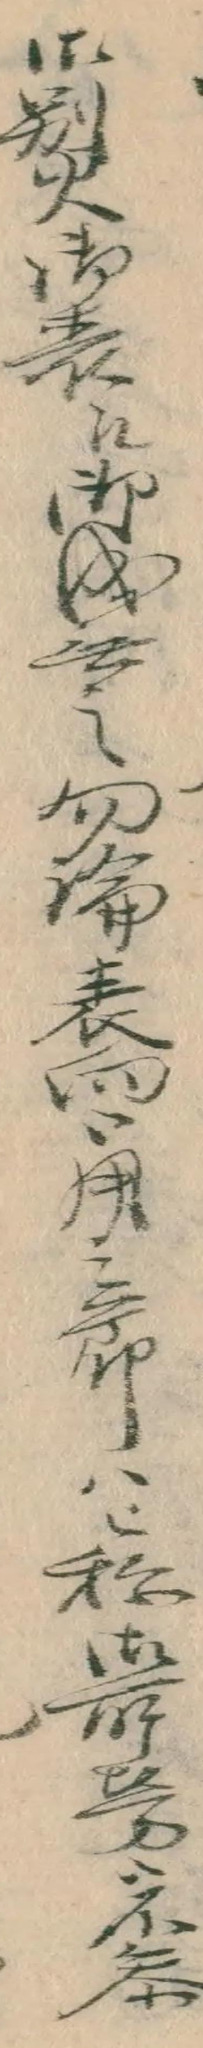御別火御表え御成無之勿論表向御用之節ハ被称御所労御不参
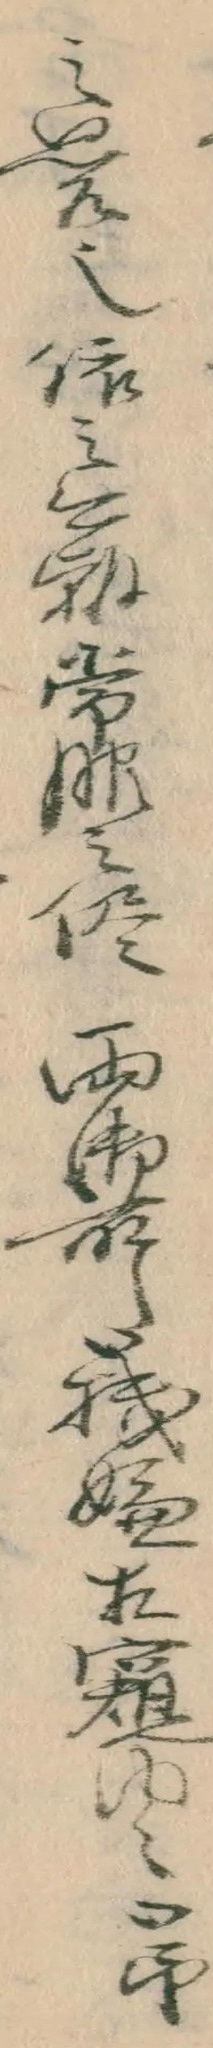之思召也依之今朝常服之侭両御所御機嫌相窺内々御弔
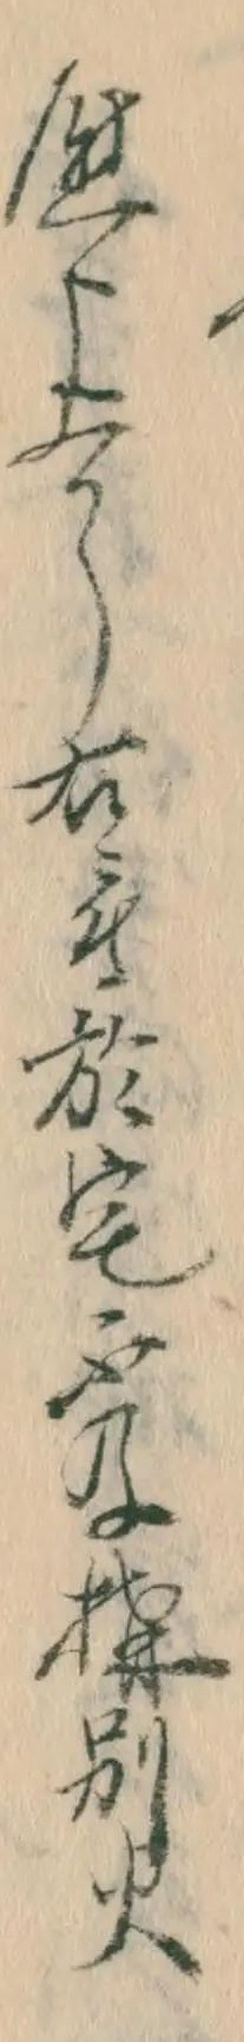慰申上了右ニ付於宅不及構別火
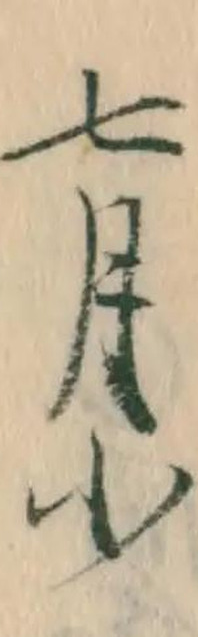七月小
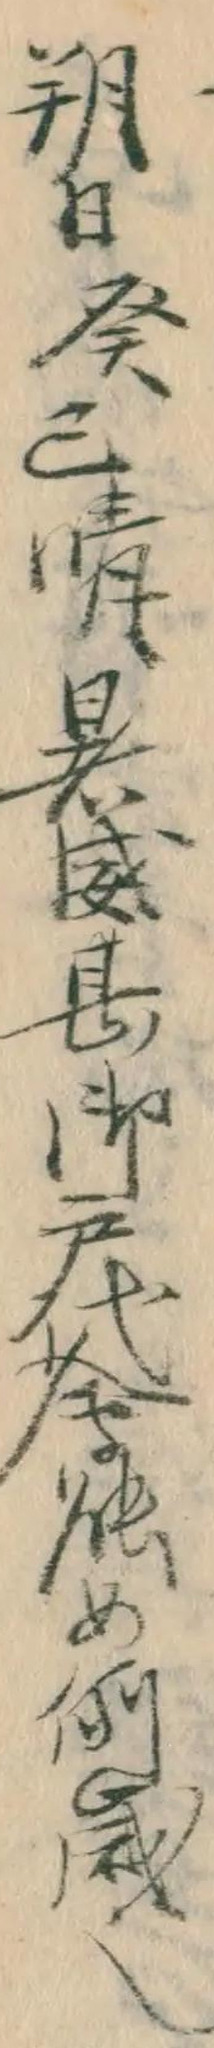朔日癸巳晴暑威甚御戸代會能如例歳也
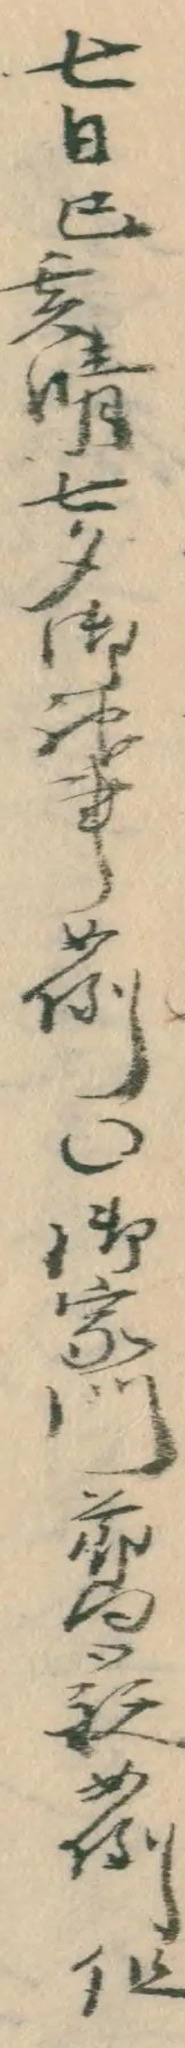七日己亥晴七夕御神事如例〇御家門節句御祝如例但
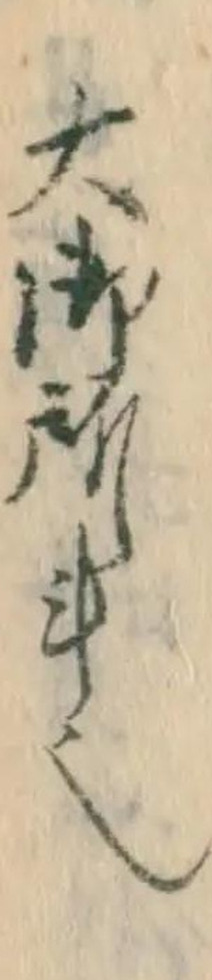大御所斗也

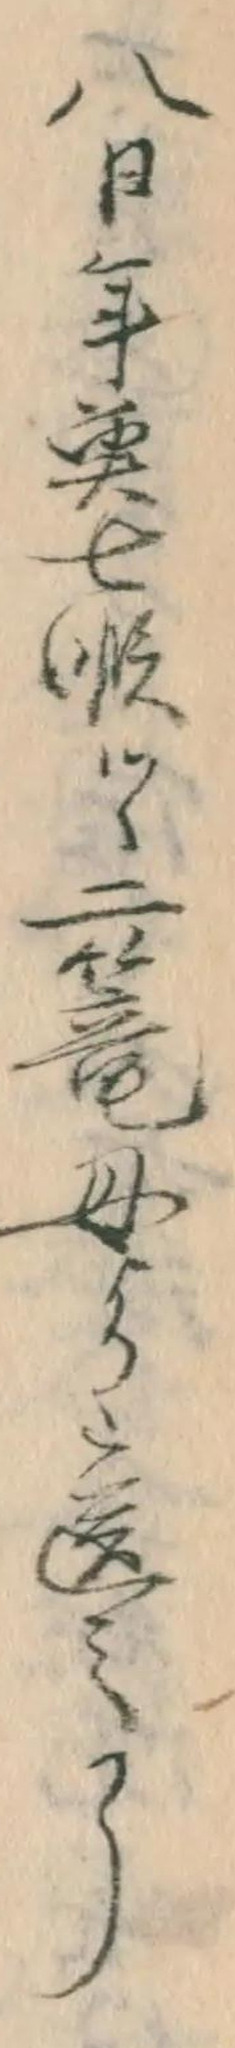八日年魚七喉ツヽ二篭母より被送之了
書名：賀茂社記録. 第65冊
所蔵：国立国会図書館 National Diet Library, JAPAN
